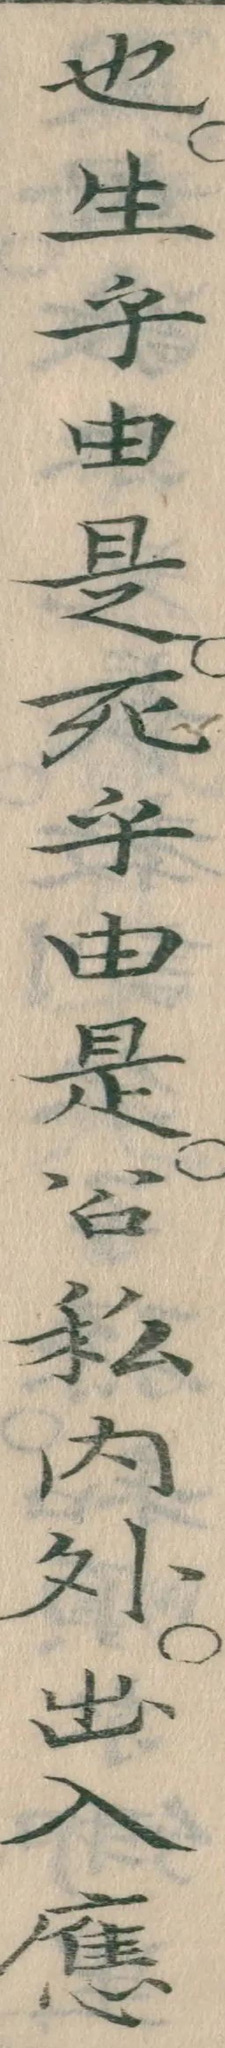也。生乎由是。死乎由是。私内外。出入応
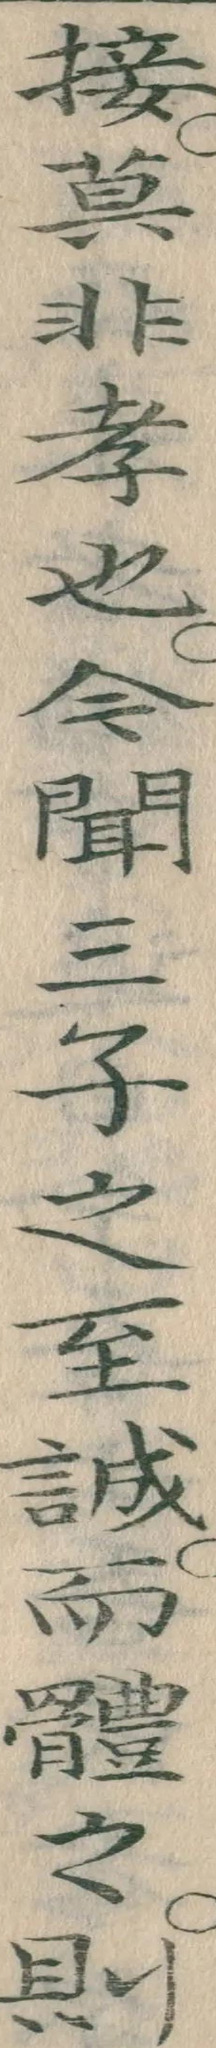接。莫非孝也。今聞三子之至誠。而体之。則
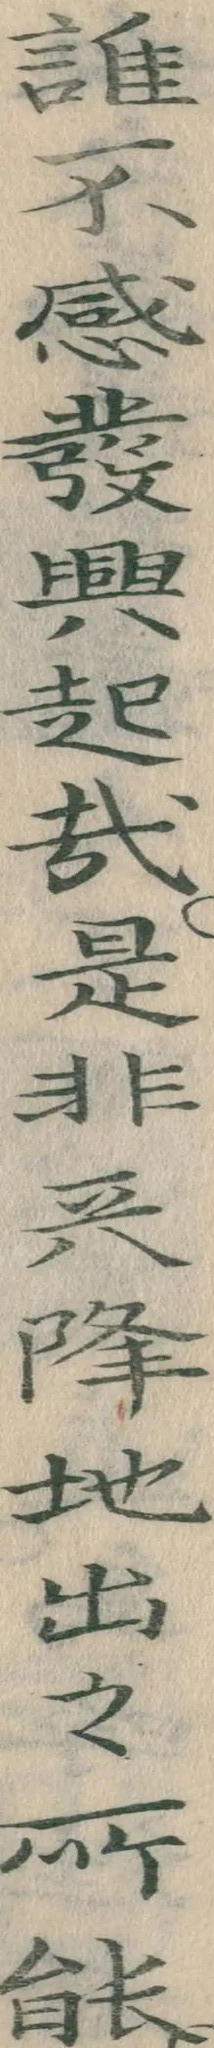誰不感発興起哉。是非天降地出之所能。
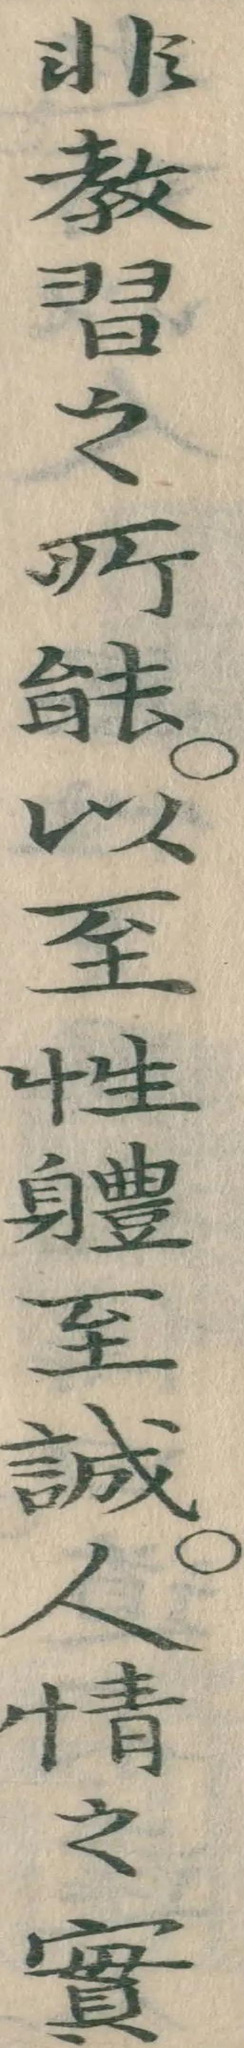非教習之所能。以至性体至誠。人情之実

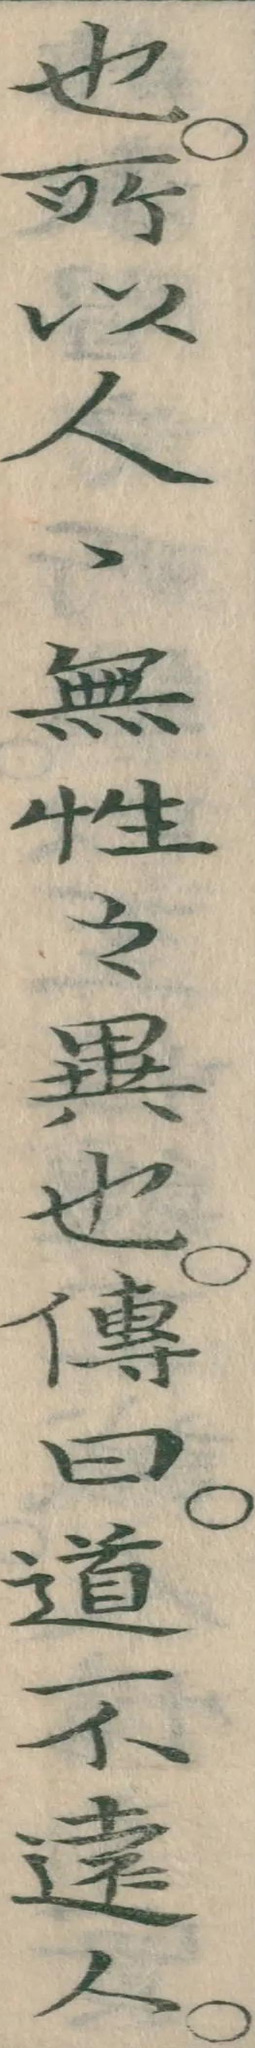也。所以人々無性之異也。伝曰。道不遠人。
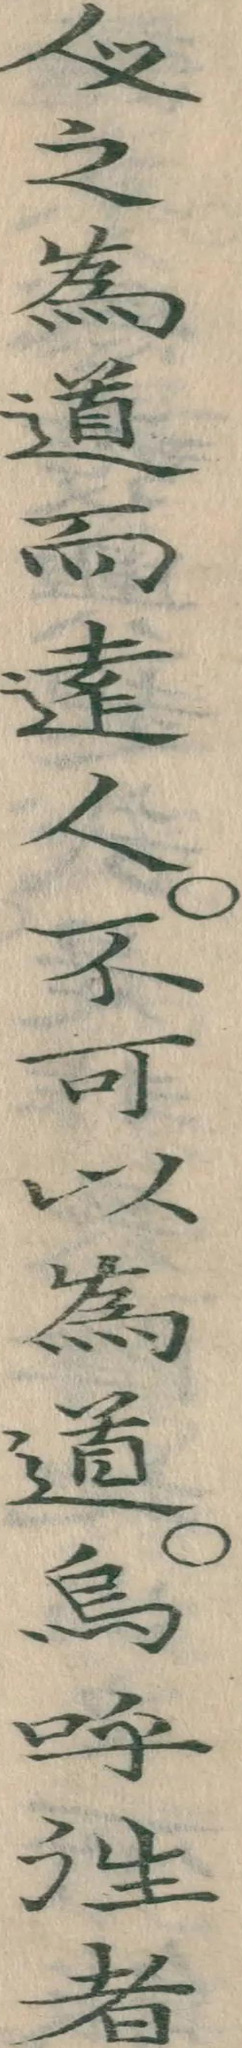之為道而遠人。不可以為道。烏呼往者
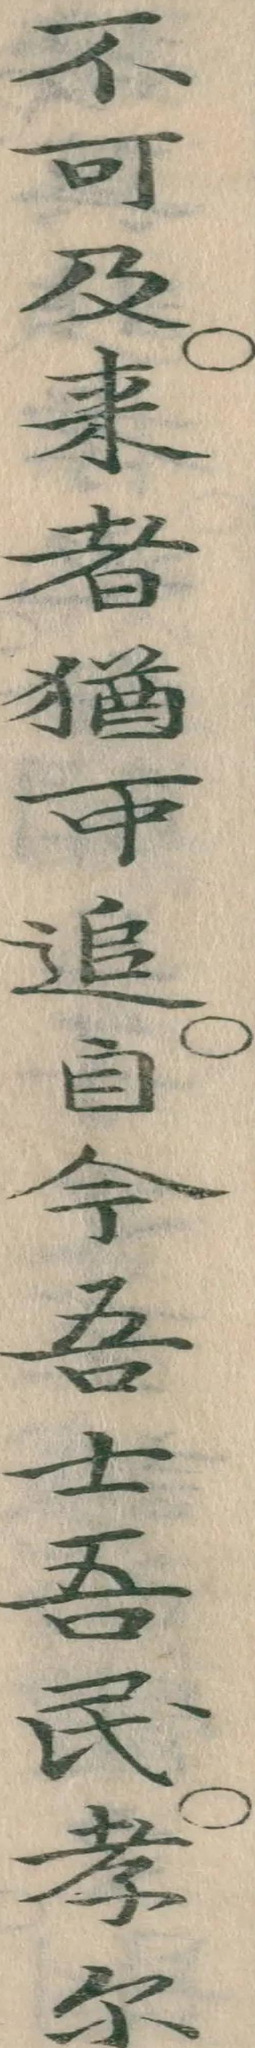不可及。来者猶追。自今吾士吾民。孝爾
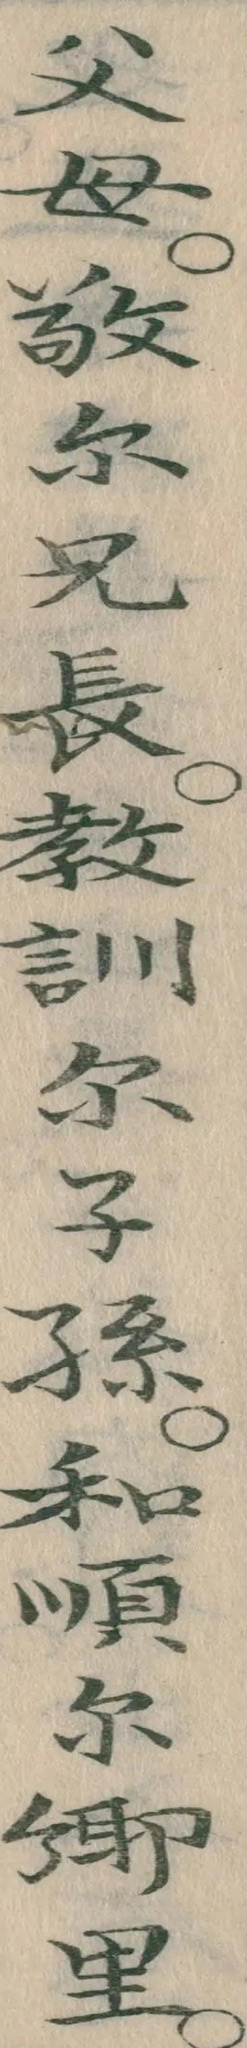父母。敬爾兄長。教訓爾子孫。和順爾里。
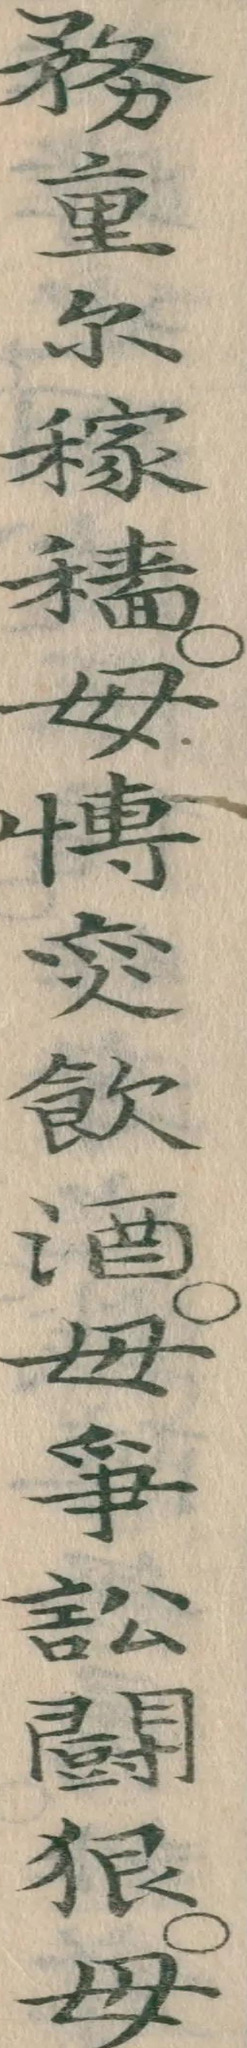務重爾稼穡。母博奕飲酒。母争訟闘。母
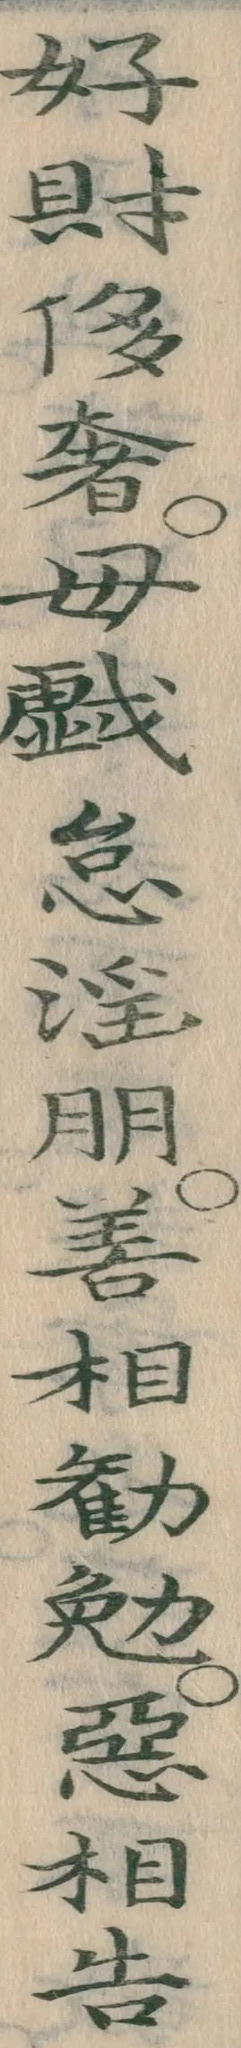好財侈奢。母戯怠淫朋。善相勧勉。悪相告
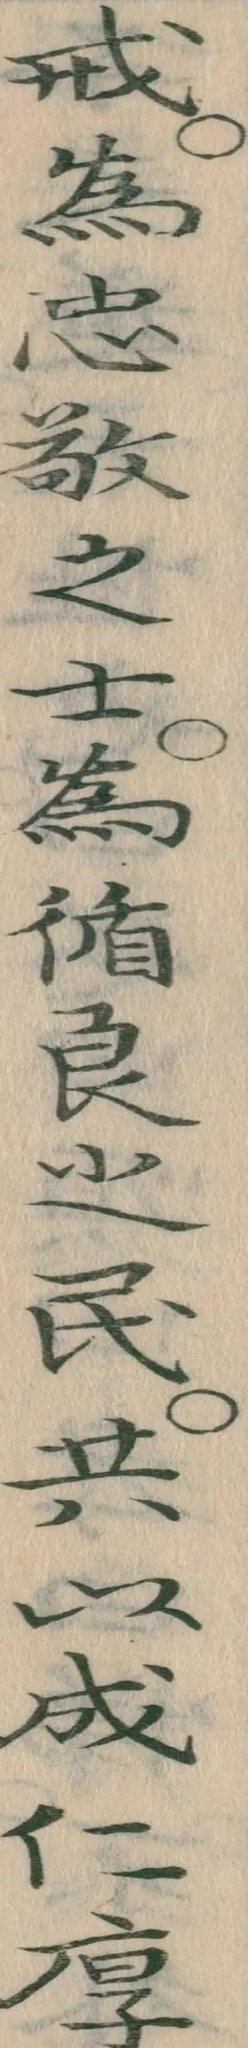戒。為忠敬之士。為循良之民。共以成仁厚
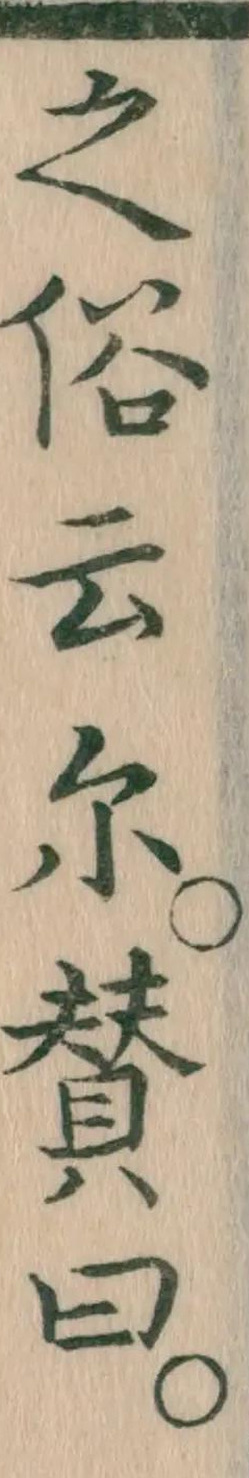之俗云爾。賛曰。
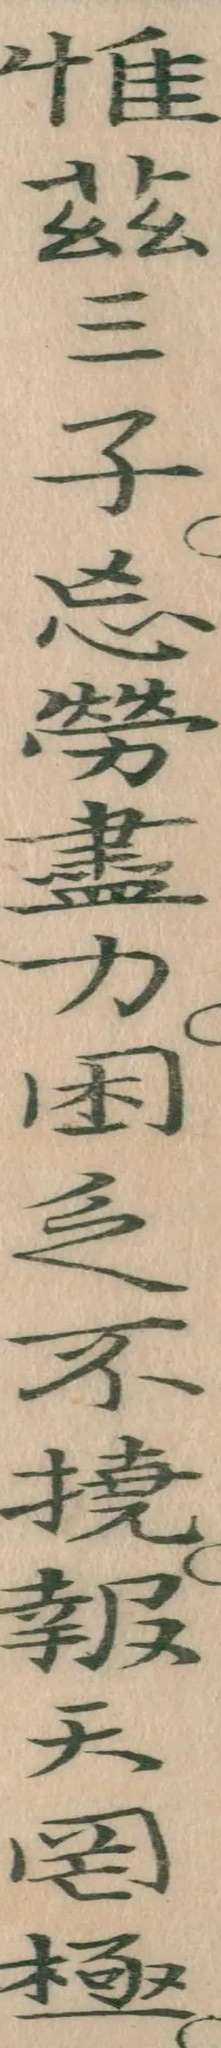惟茲三子。忘労尽力。困乏不。報天罔極。
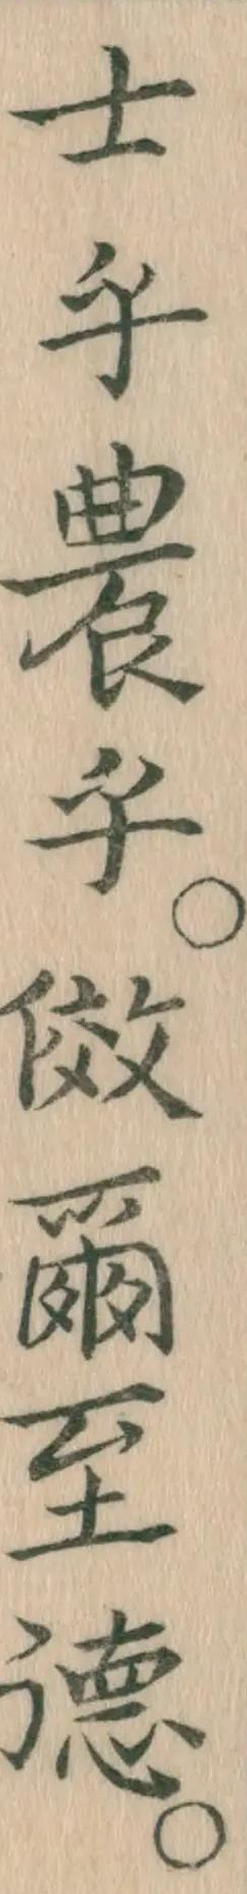士乎農乎。傚爾至徳。
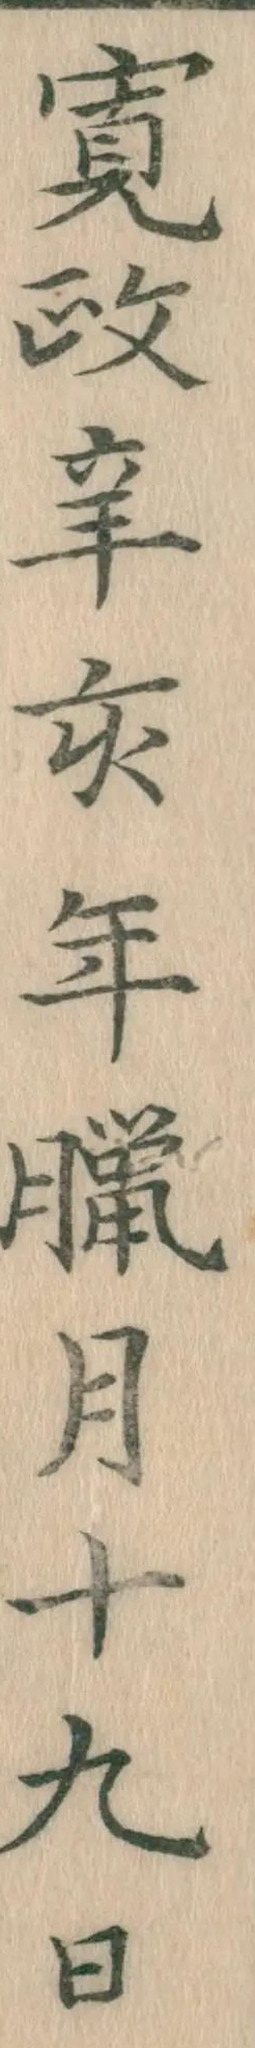寛政辛亥年臘月十九日
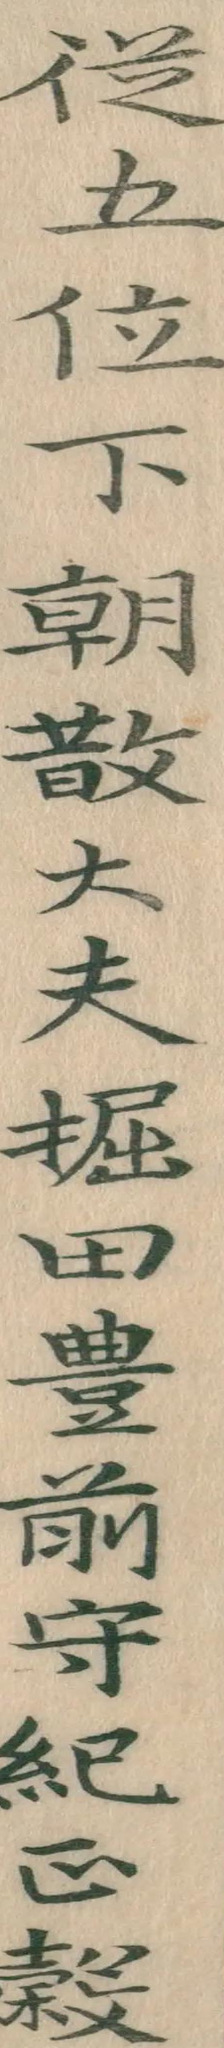従五位下朝散大夫堀田豊前守紀正穀
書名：輪池叢書. 12
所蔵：国立国会図書館 National Diet Library, JAPAN
